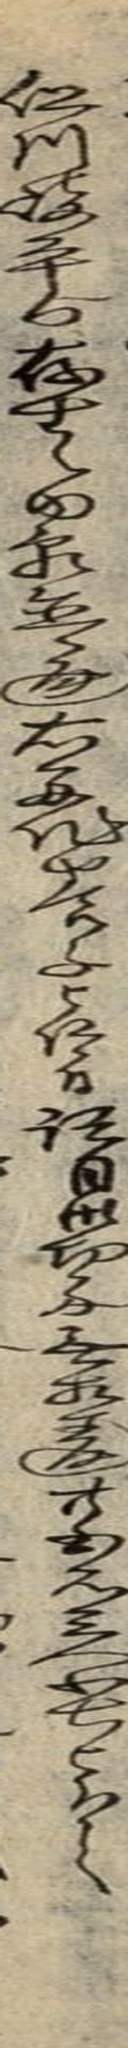但川崎平右衛門存生之内願置候通右多作養子被仰付跡目御切米無相違廿五石三人ふち被下之
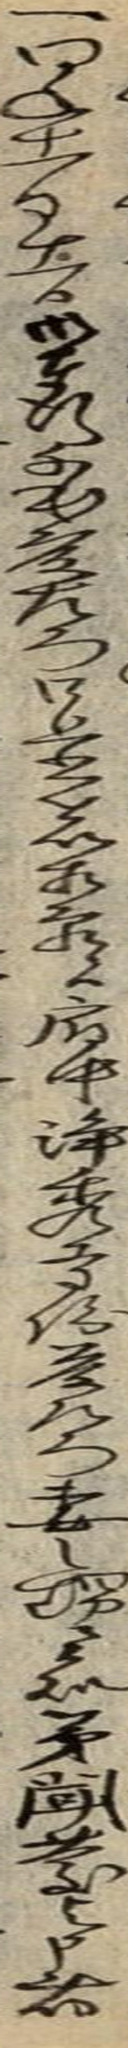一同年十一月十一日御奉行千本藤左衛門口上書を以相願候は府中浄秀寺儀藤左衛門妻之甥に候処弟聞慶と申者
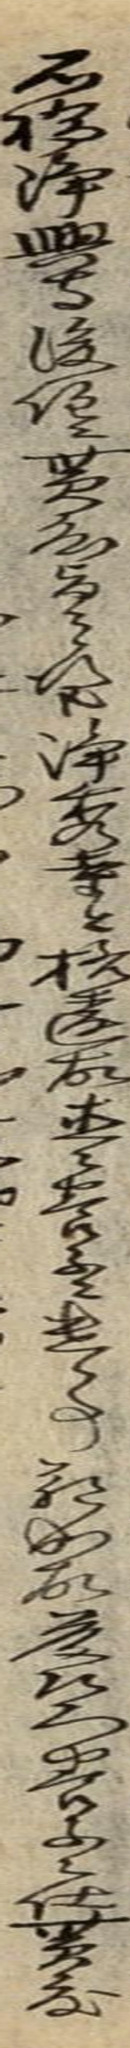石橋浄興寺後住に貰度旨に候得共浄秀寺と格違故直に養子に遣事難成故藤左衛門養子に仕貰度
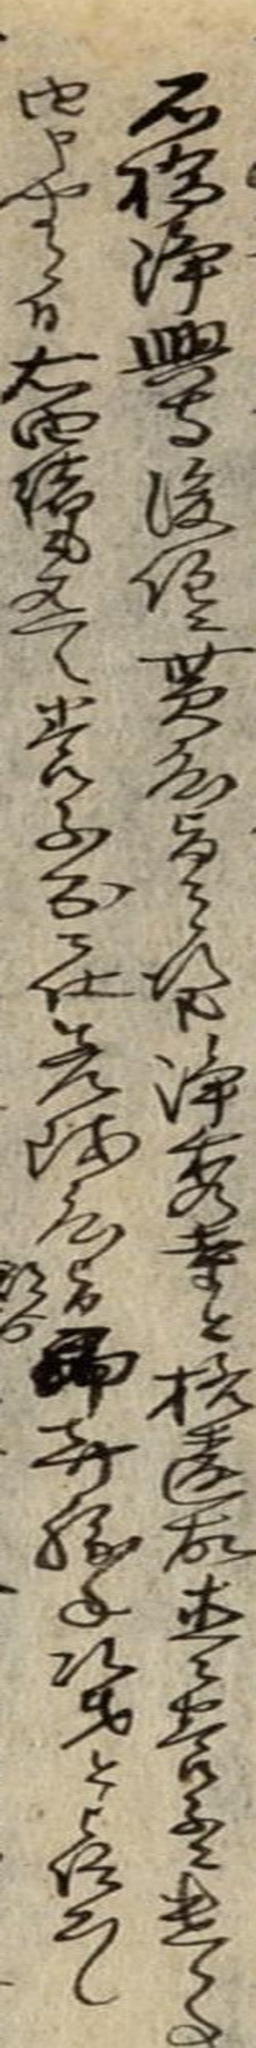由申聞候に付右由緒も有之養子分に仕差越度旨刻勝手次第と被仰出候
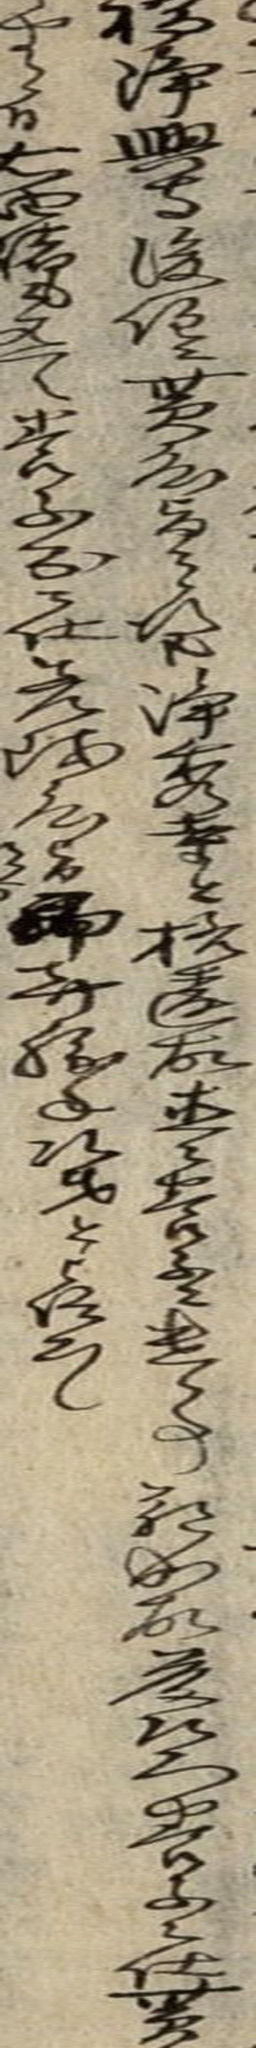由申聞候に付右由緒も有之養子分に仕差越度旨刻勝手次第と被仰出候
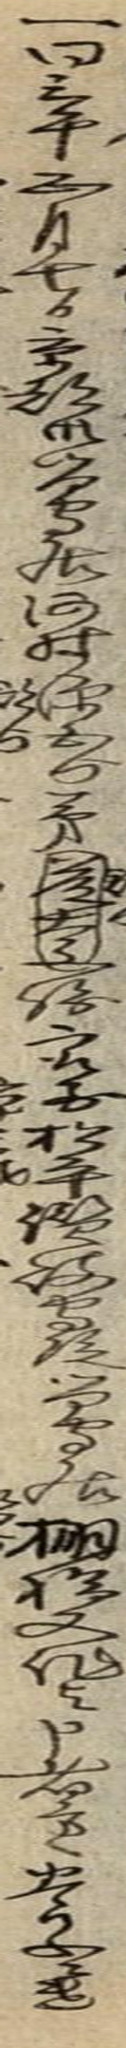一同三午正月七日京都御留守居河村源五右衛門弟藤大夫郡右衛門儀最前松平讃岐守殿留守居棚橋又作と申者方へ養子に遣
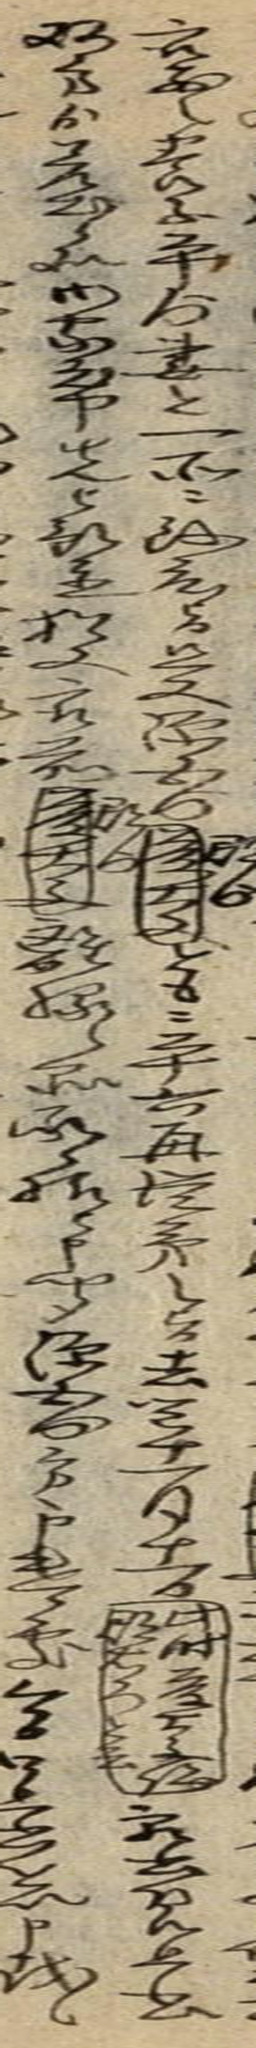双方ゟ差出候処御家老中先被預置猶又最前藤大夫離縁之品承候様被申聞源五右衛門方へ申遣候処今日口上書を以申越候
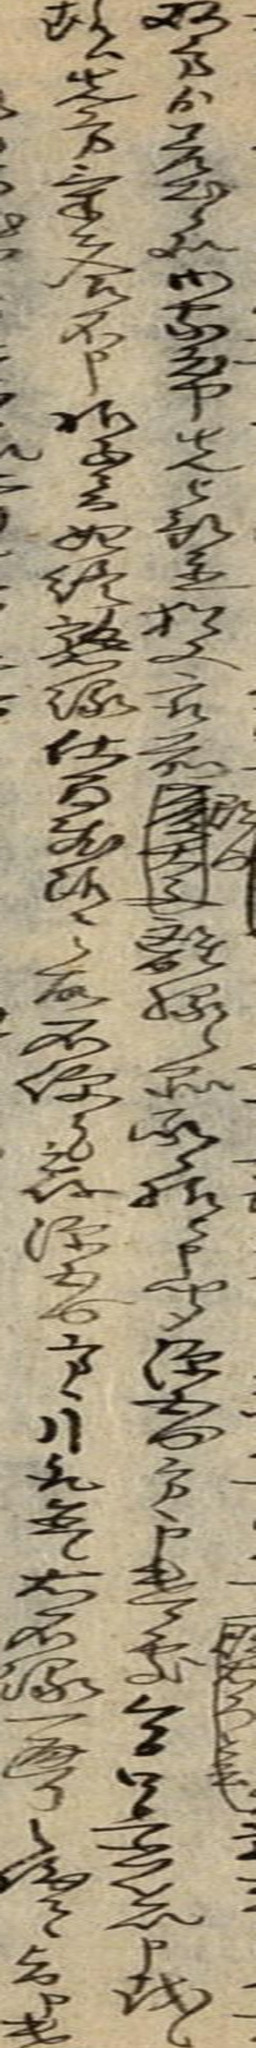趣は先方気に合不申様子に而始終熟縁仕間敷趣に候故不評にも存源五右衛門方へ引取置候右不縁一通り之儀に候旨申遣候
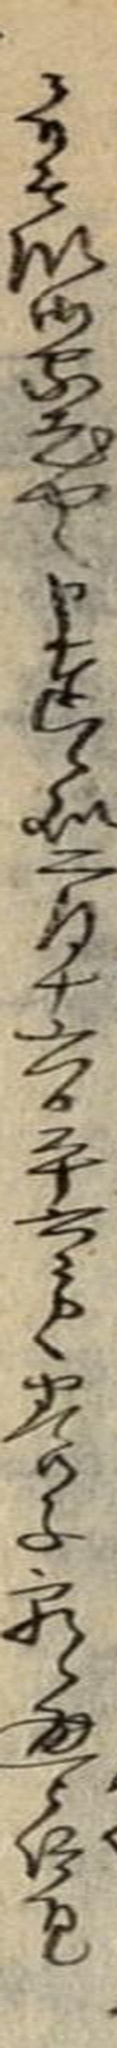に付其段御家老へ申達候処二月十六日平六方へ養子願候通被仰付候
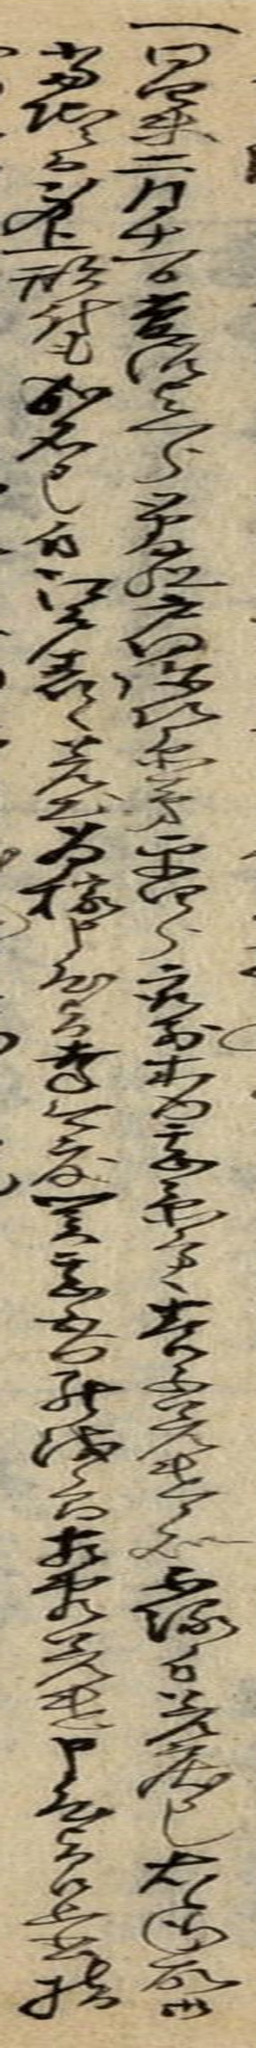当地に而身上形付も成不申候に付江戸表へ差出為稼申度旨幸今度関甚五右衛門罷越候間相願差遣申度口上書指
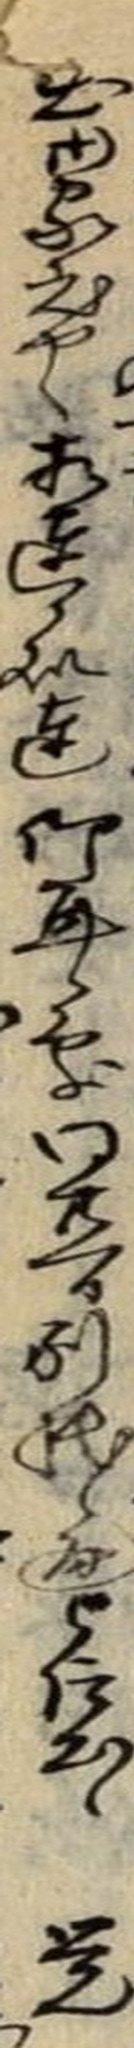出御家老中へ相達候処達御耳候処同廿一日別紙之通被仰出候覚
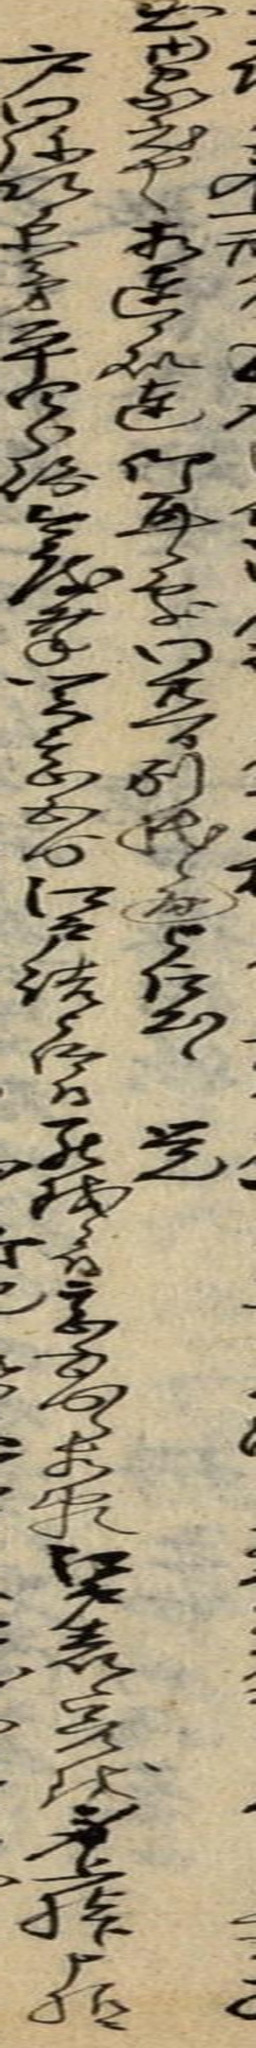戸田弥次兵衛弟平四郎儀今度幸関甚五右衛門江戸詰被仰付罷越候に付甚五右衛門相願江戸表へ差越身上挊申様に
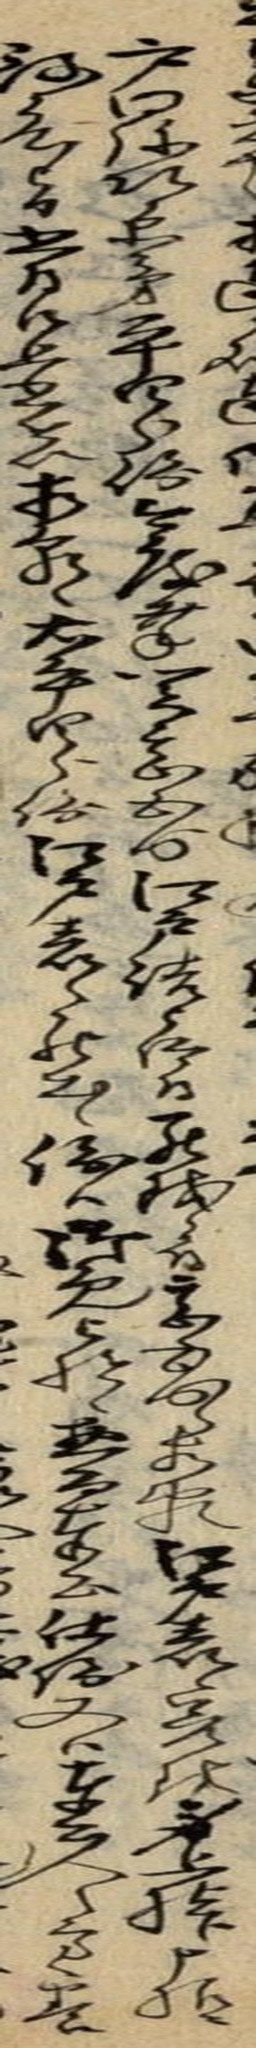致度旨書付口上書を以相願候右平四郎儀江戸表へ罷出候儀は御免被遊候惣而奉公仕儀又は奉公人之方へ養
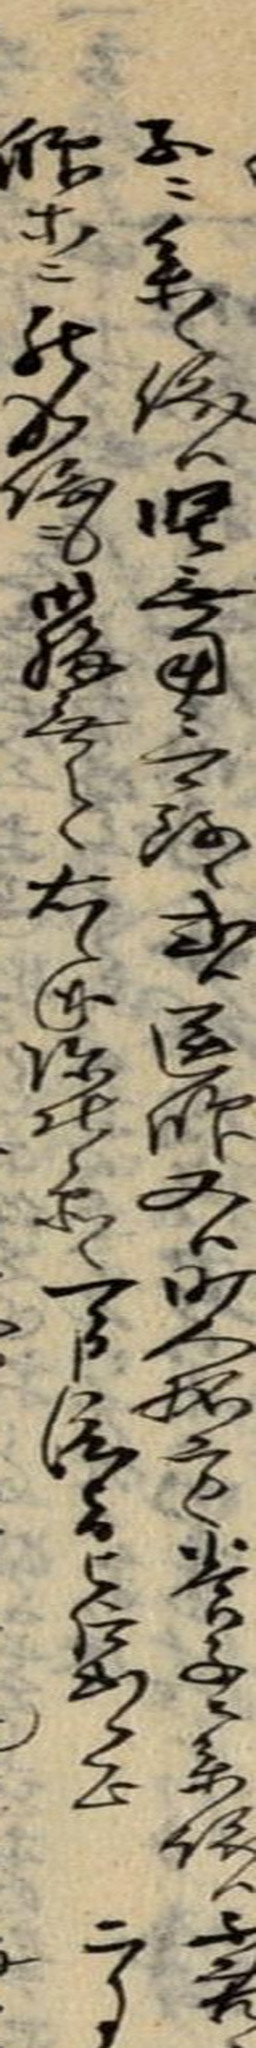師等に罷成儀も御構無之候右之趣弥次兵衛へ可申渡旨被仰出候以上二月廿一日
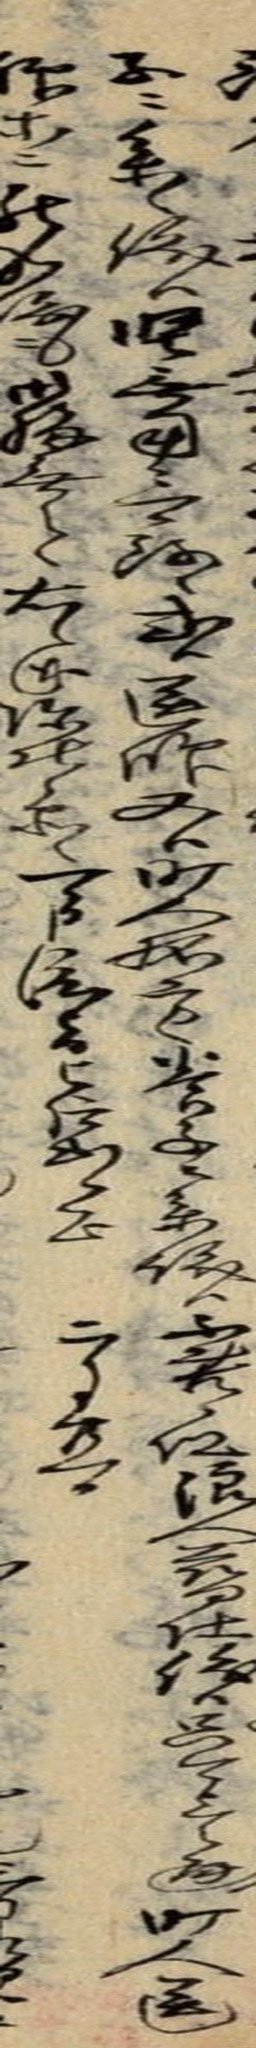師等に罷成儀も御構無之候右之趣弥次兵衛へ可申渡旨被仰出候以上二月廿一日
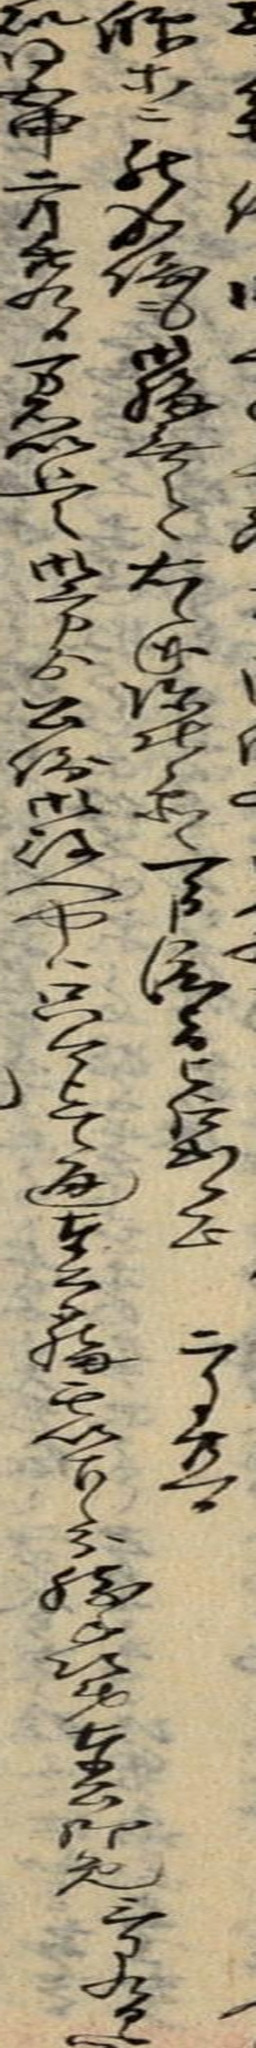然る処同五申二月廿九日万石以上之御方ゟ公儀御役人中は只今迄之通奉公御構其以下之分勝手次才奉公御免三月九日留
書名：養子縁組之部
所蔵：福井県文書館 Fukui Prefectural Archives
